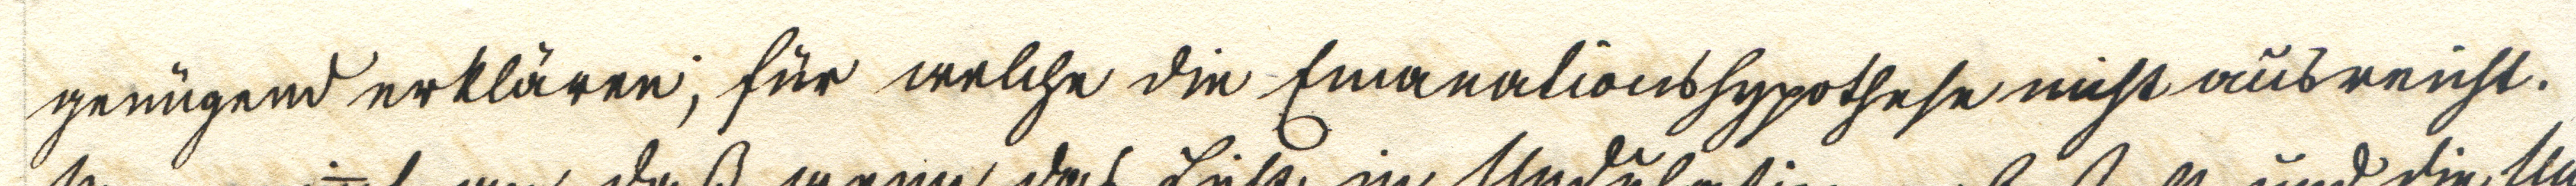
genügend erklären; für welche die Emanationshypothese nicht ausreicht.
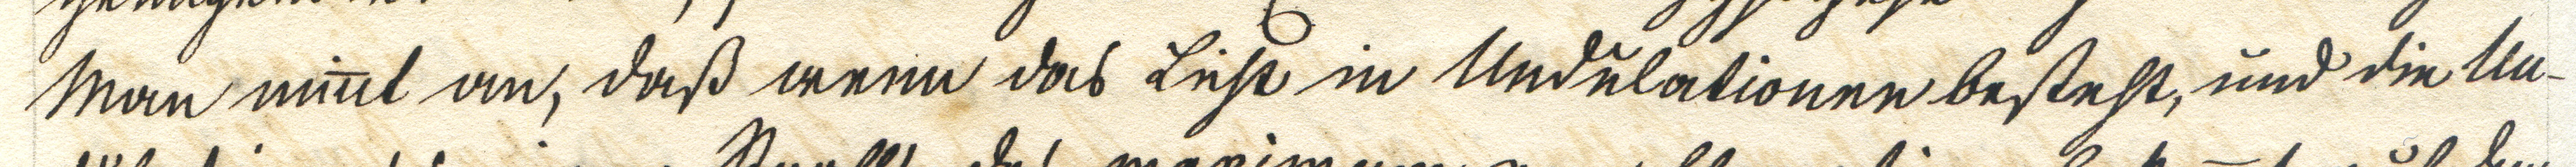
Man nim̃t an, daß wenn das Licht in Undulationen besteht, und die Un-
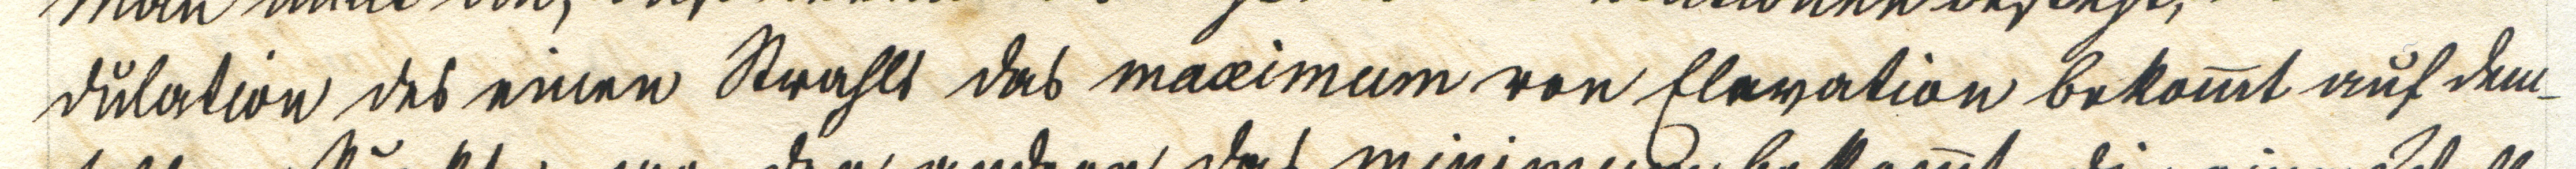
dulation des einen Strahls das maximum von Elaevation bekom̃t auf dem-
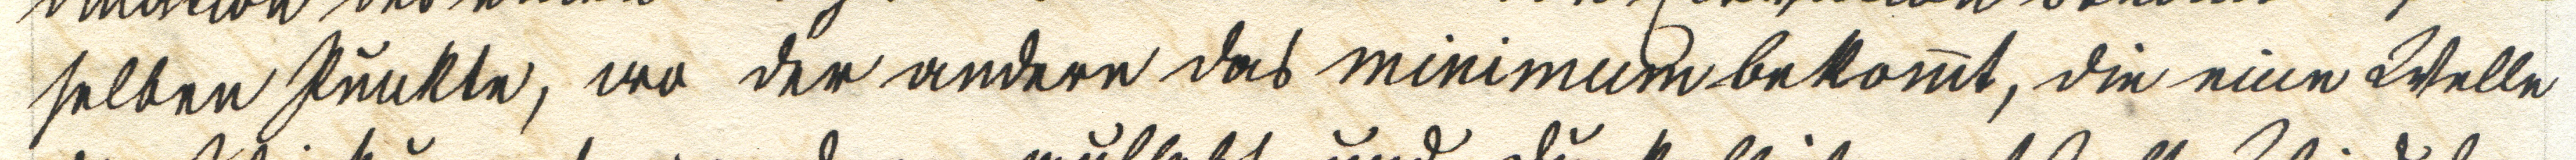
selben Punkte, wo der andere das minimum bekom̃t, die eine Welle
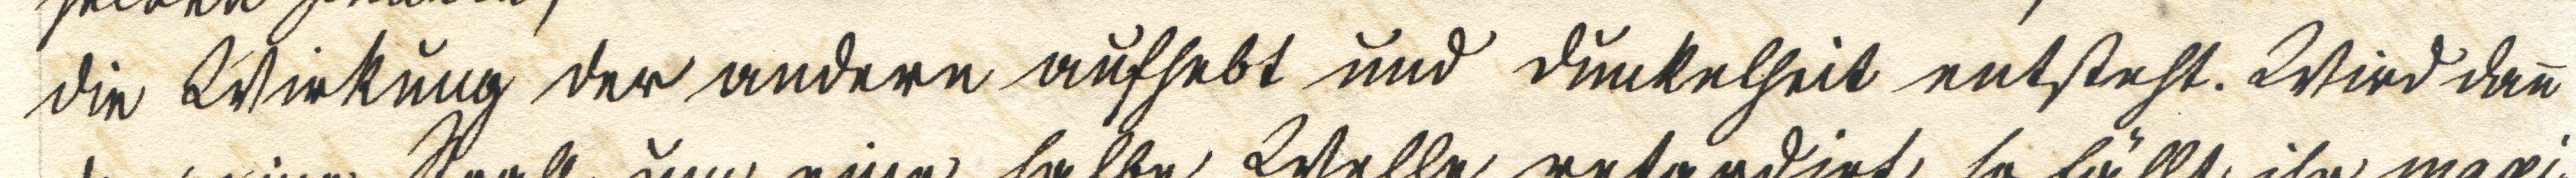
die Wirkung der andern aufhebt und Dunkelheit entsteht. Wird dañ
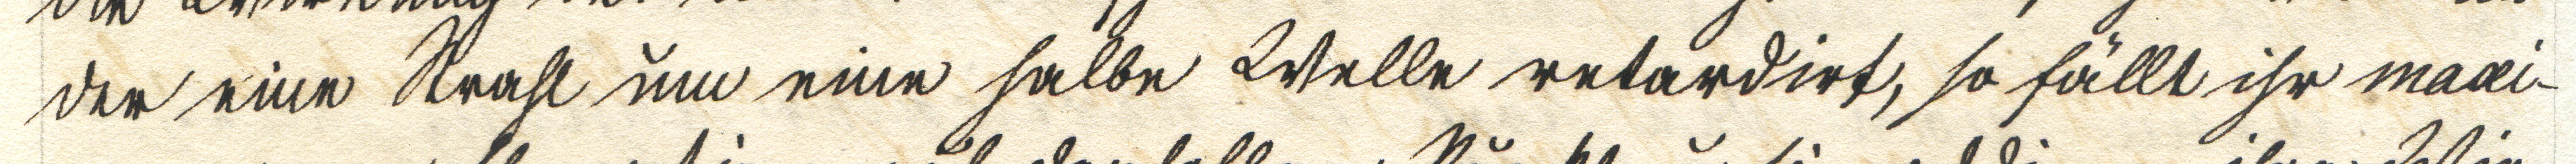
der eine Strahl um eine halbe Welle retardirt, so fällt ihr maxi-
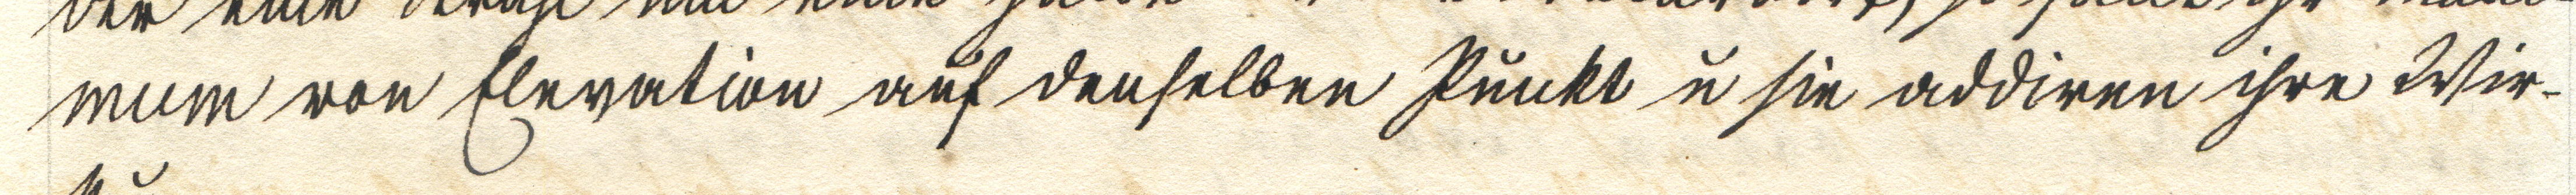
mum von Elevation auf denselben Punkt u sie addiren ihre Wir-
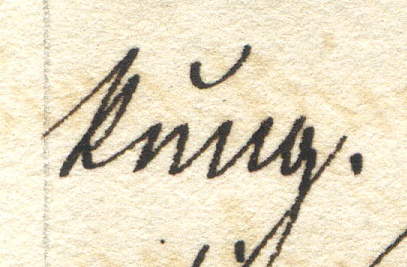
kung.
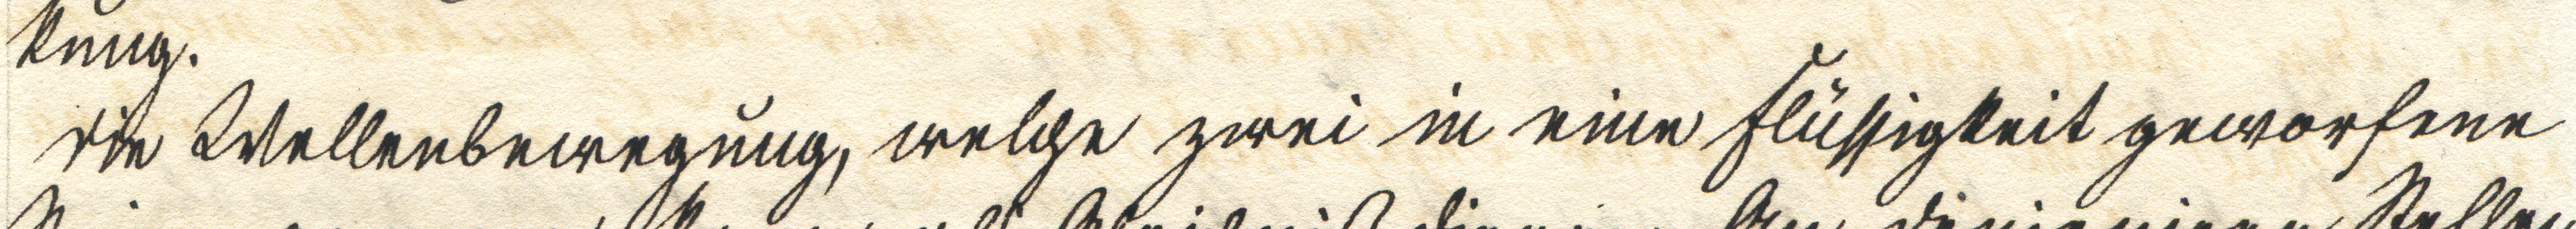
Die Wellenbewegung, welche zwei in eine Flüssigkeit geworfene
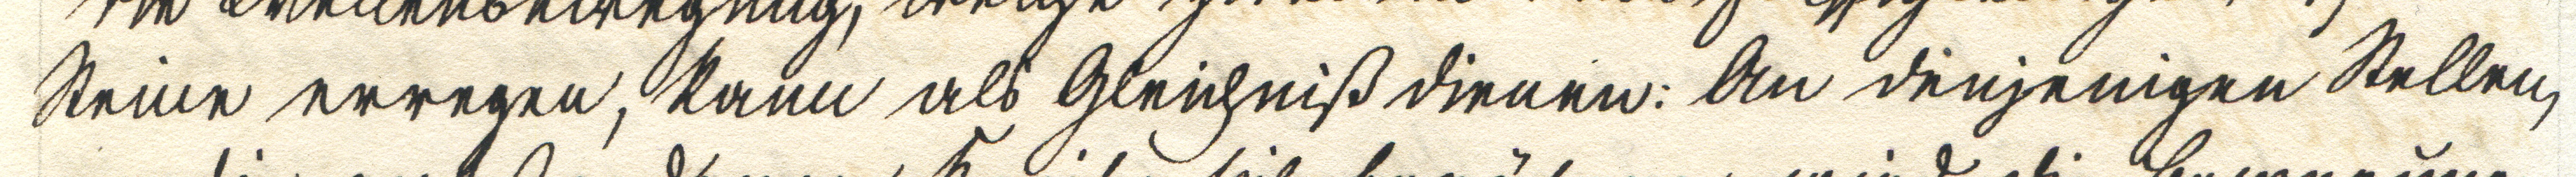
Steine erregen, kann als Gleichniß dienen: An denjenigen Stellen,
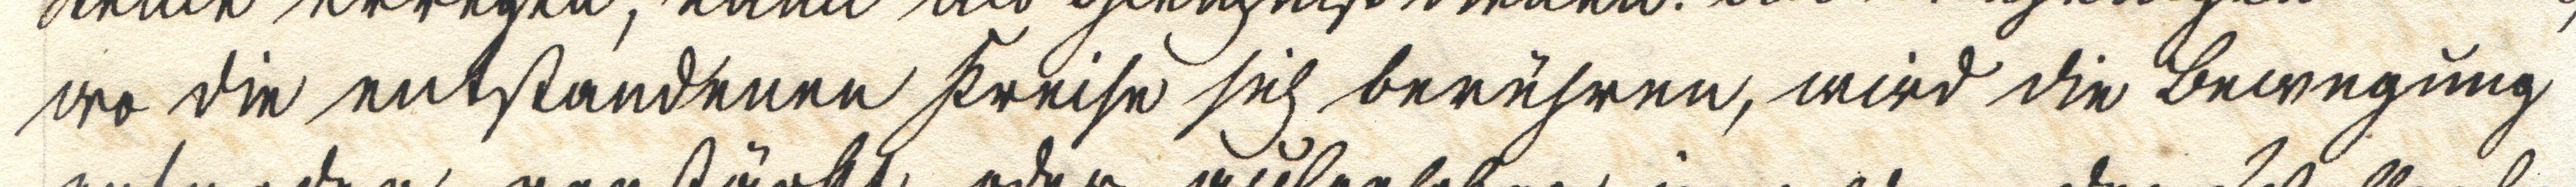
wo die entstandenen Kreise sich berühren, wird die Bewegung
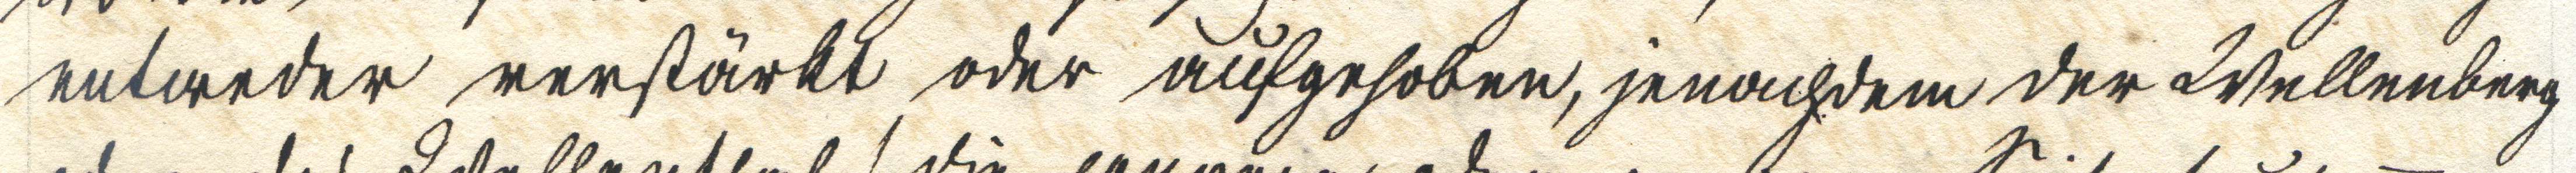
entweder verstärkt oder aufgehoben, jenachdem der Wellenberg
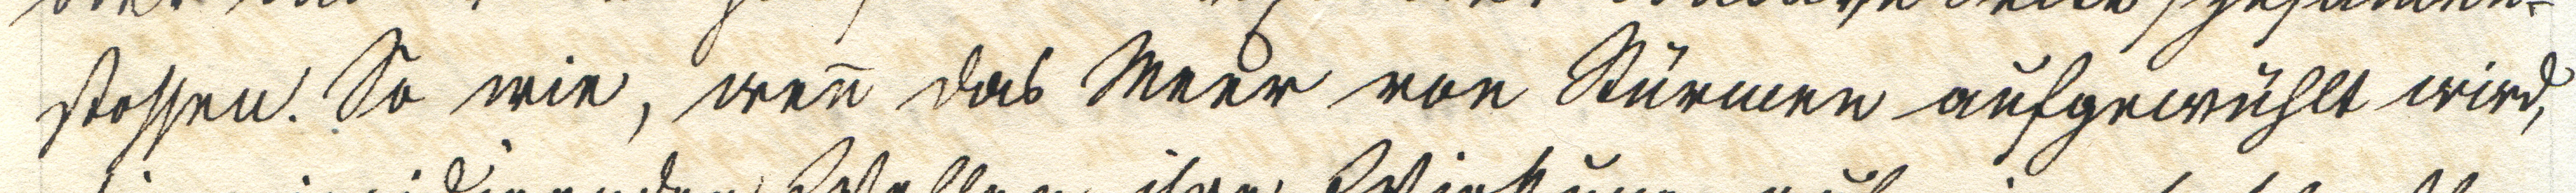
stossen. So wie, weñ das Meer von Stürmen aufgewühlt wird,
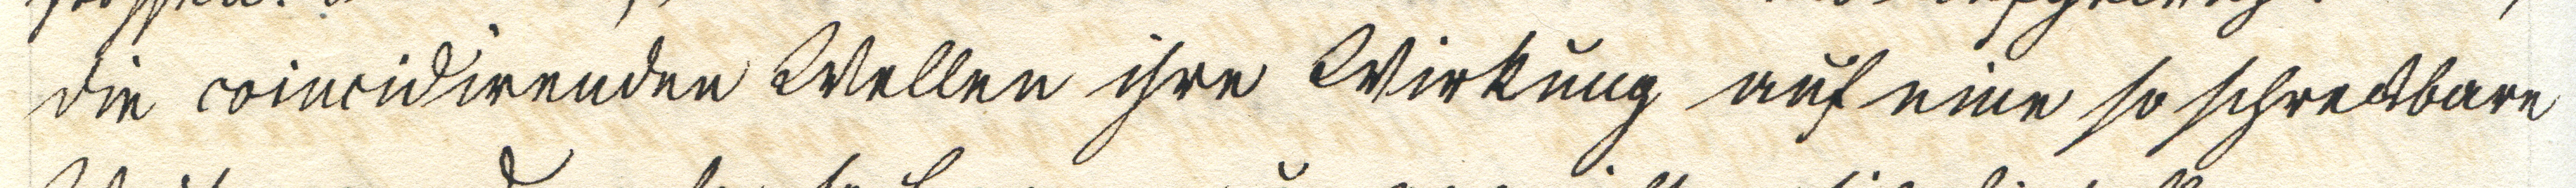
die coincidirenden Wellen ihre Wirkung auf eine so schreckbare
